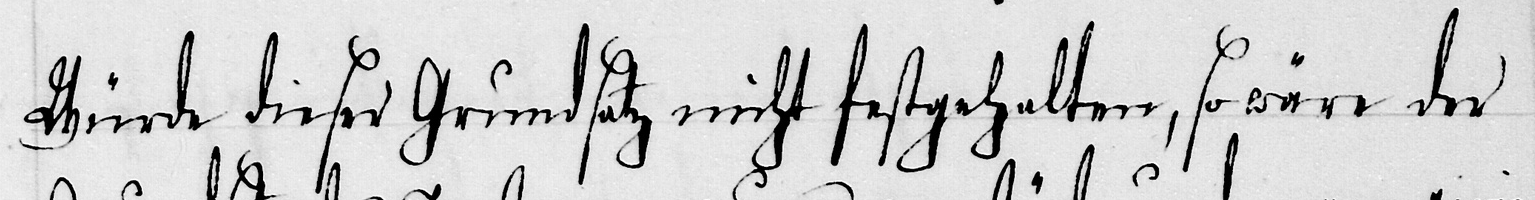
Würde dieser Grundsatz nicht festgehalten, so wäre der
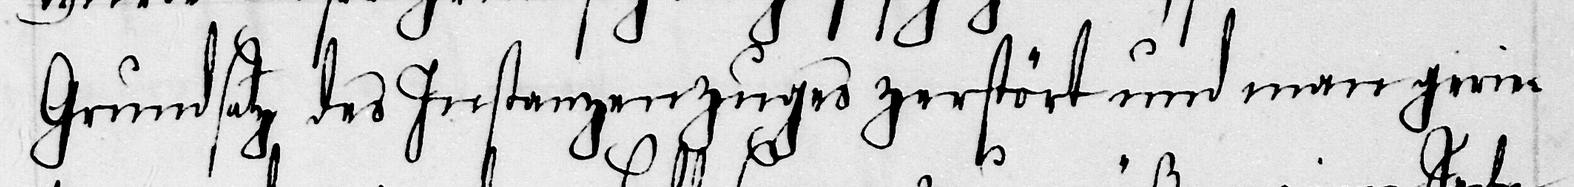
Grundsatz des Instanzenzuges zerstört und man gerie¬
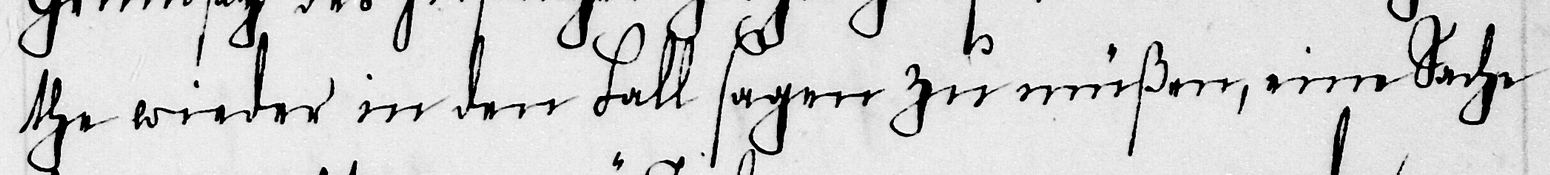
the wieder in den Fall sagen zu müßen, eine Sache
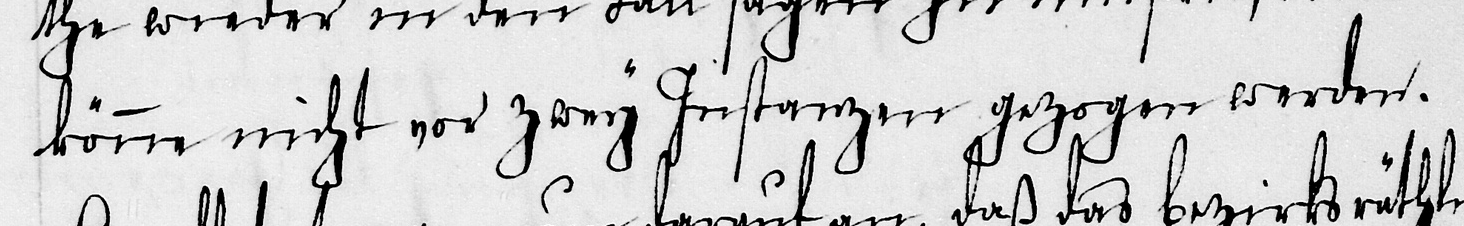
könne nicht vor zwey Instanzen gezogen werden.
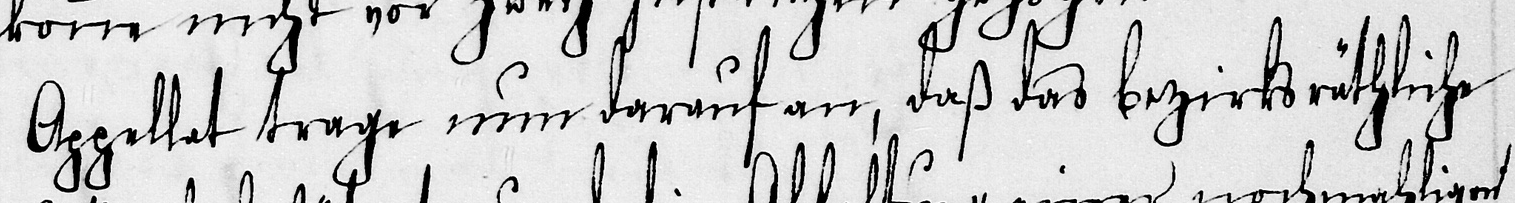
Appellat trage nun darauf an, daß das bezirksräthliche
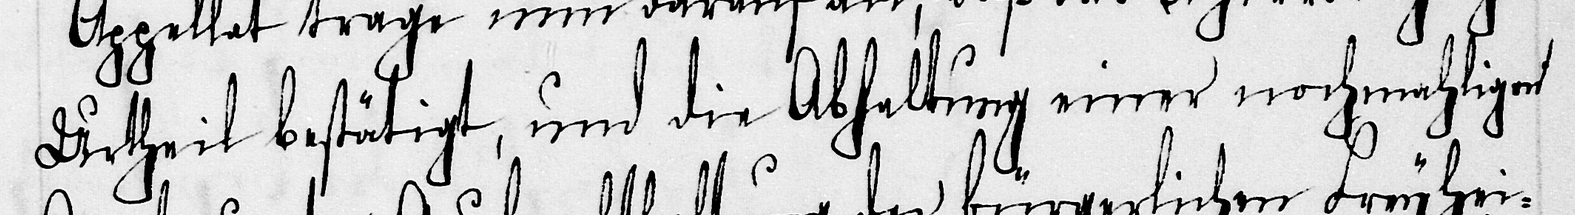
Urtheil bestätigt, und die Abhaltung einer nochmahligen
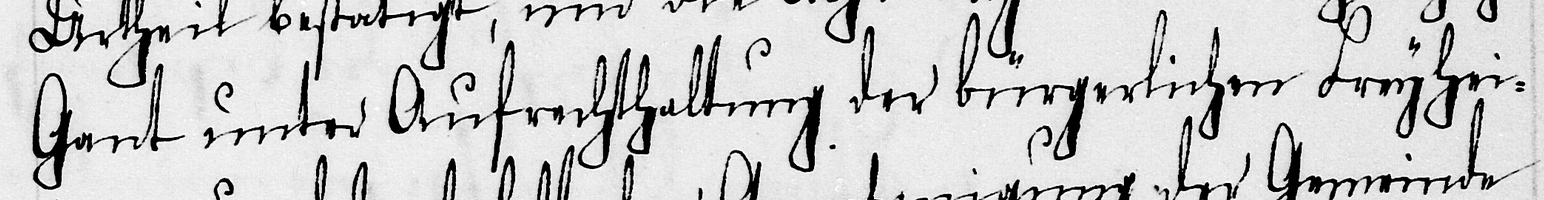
Gant unter Aufrechthaltung der bürgerlichen Freyhei¬
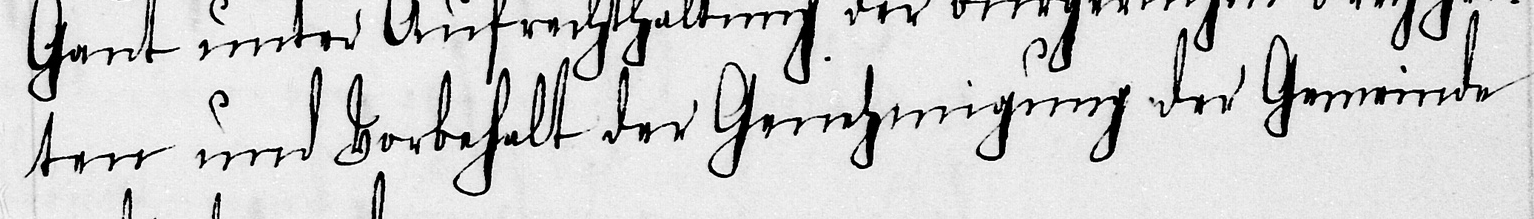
ten und Vorbehalt der Genehmigung der Gemeinde
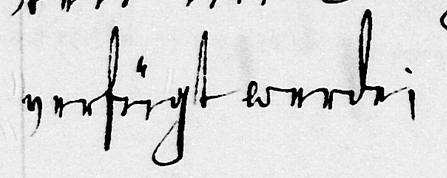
verfügt werde;
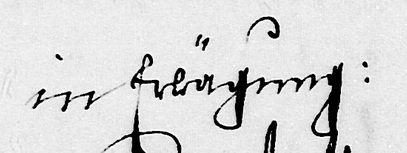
in Erwägung:
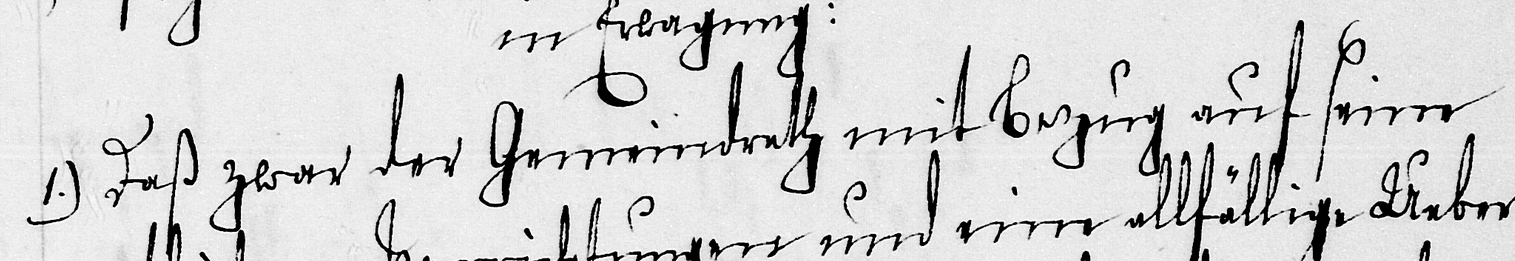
1.) Daß zwar der Gemeindrath mit Bezug auf seine
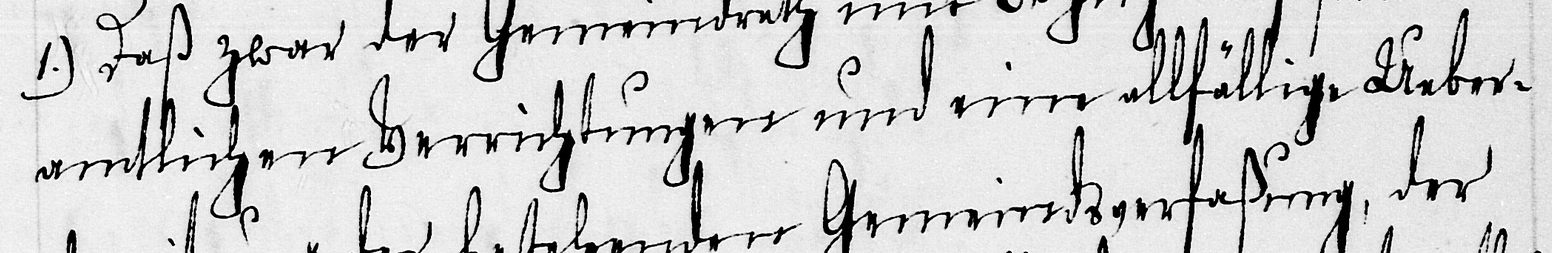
amtlichen Verrichtungen und eine allfällige Ueber¬
